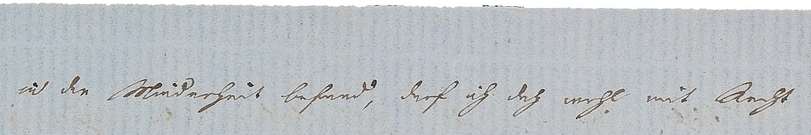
in der Minderheit befand,
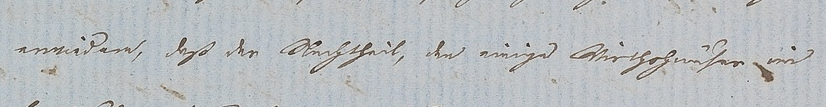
erwiedern, daß der Nachtheil, den einige Wirthshäuser im
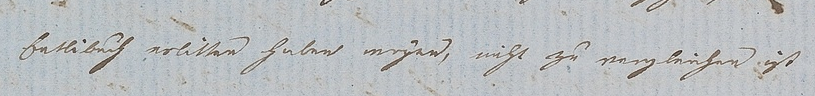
Entlibuch erlitten haben mögen, nicht zu vergleichen ist
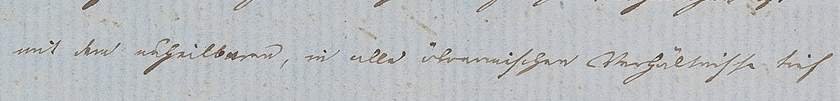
mit dem unheilbaren, in alle ökonomischen Verhältnisse tief
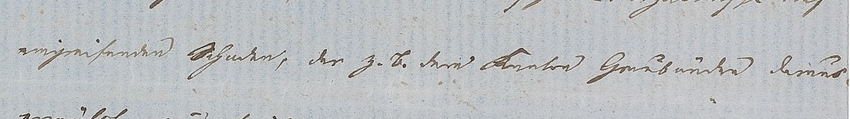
eingreifenden Schaden, der z. B. dem Kanton Graubünden daraus
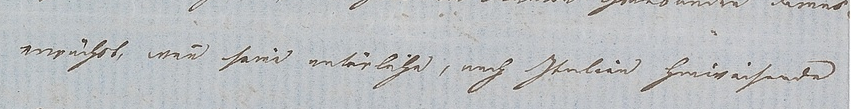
erwächst, wenn seine natürliche, nach Italien hinweisende
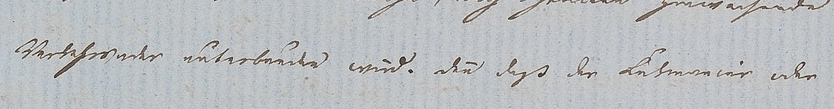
Verkehrsader unterbunden wird. Denn daß der Lukmanier oder
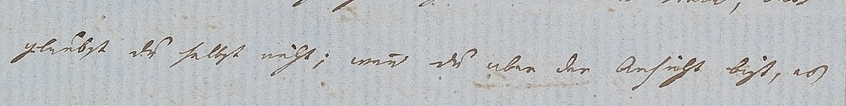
glaubst Du selbst nicht; wenn Du aber der Ansicht bist, es
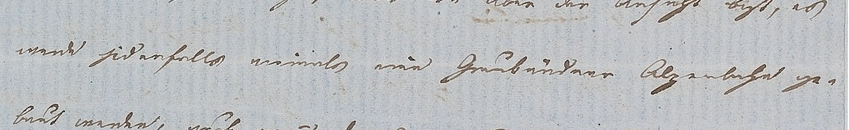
werde jedenfalls niemals eine GraubündnerAlpenbahn ge-
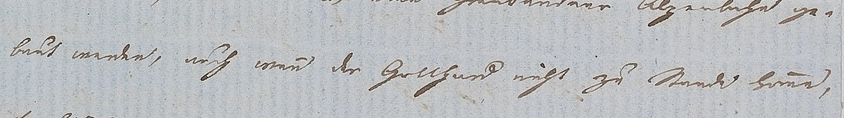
baut werden, auch wenn der Gotthard nicht zu Stande komme,
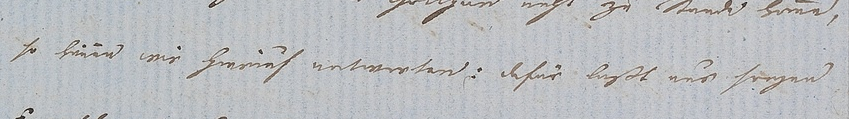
so können wir hierauf antworten: dafür laßt uns sorgen
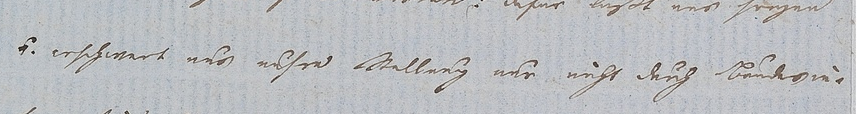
u. erschwert uns unsre Stellung nur nicht durch Bundesin-
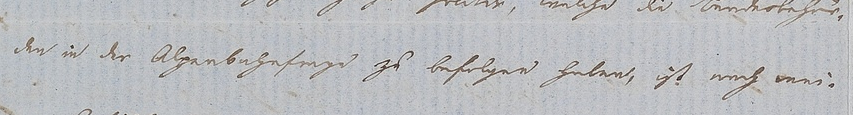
den in der Alpenbahnfrage zu befolgen haben, ist nach mei-
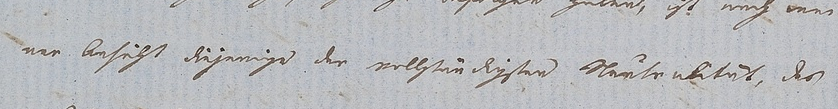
ner Ansicht diejenige der vollständigsten Neutralität, des
